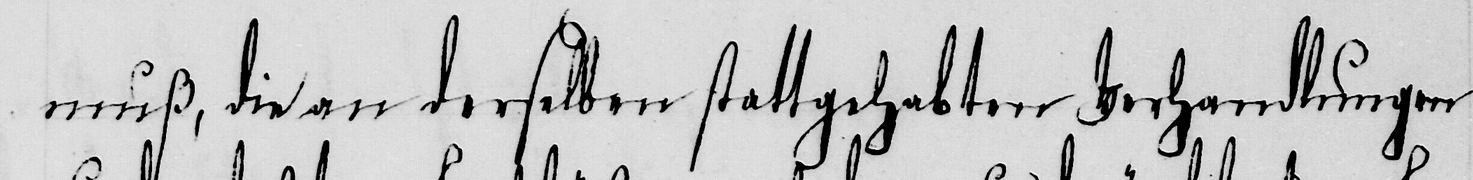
muß, die an derselben stattgehabten Verhandlungen
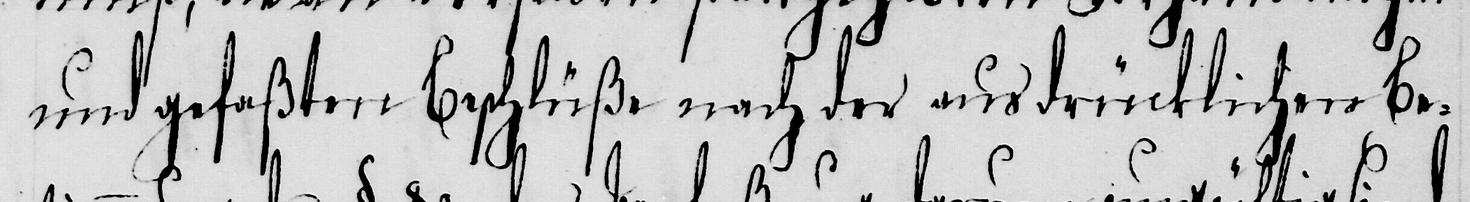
und gefaßten Beschlüße nach der ausdrücklichen Be¬
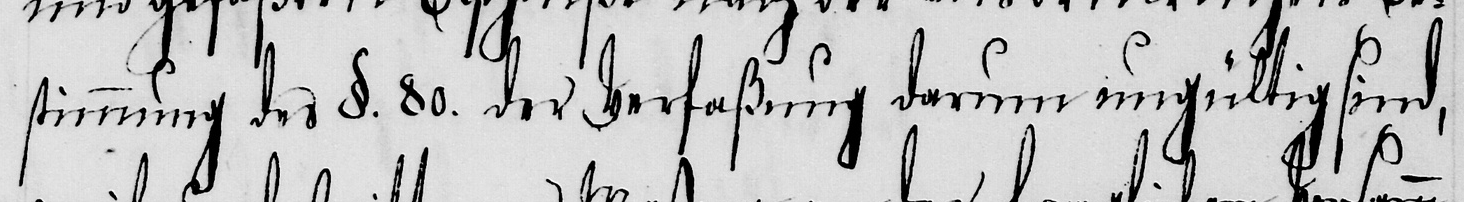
stimmung des §. 80 der Verfaßung darum ungültig sind,
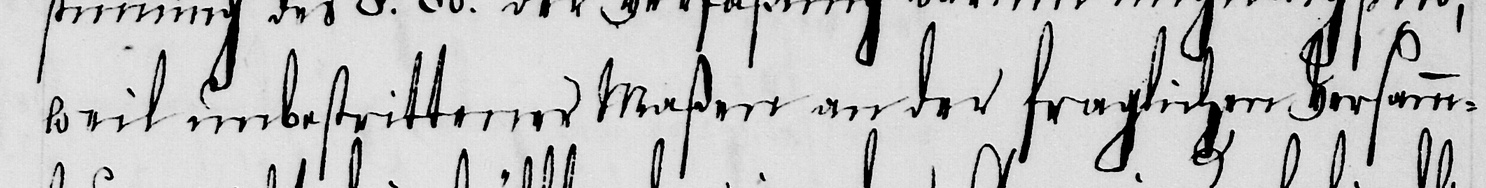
weil unbestrittener Maßen an der fraglichen Versamm¬
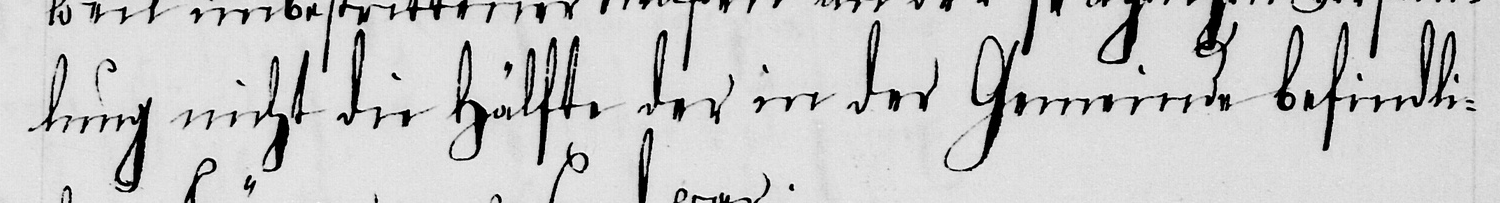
lung nicht die Hälfte der in der Gemeinde befindl¬
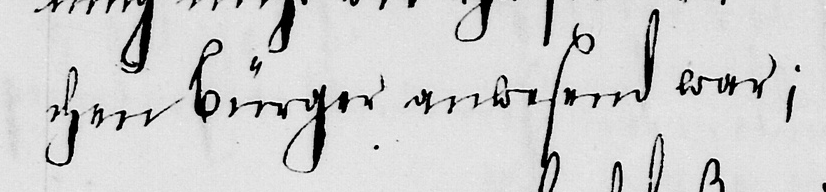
ichen Bürger anwesend war;
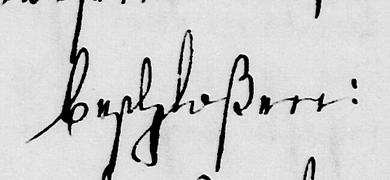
beschloßen:
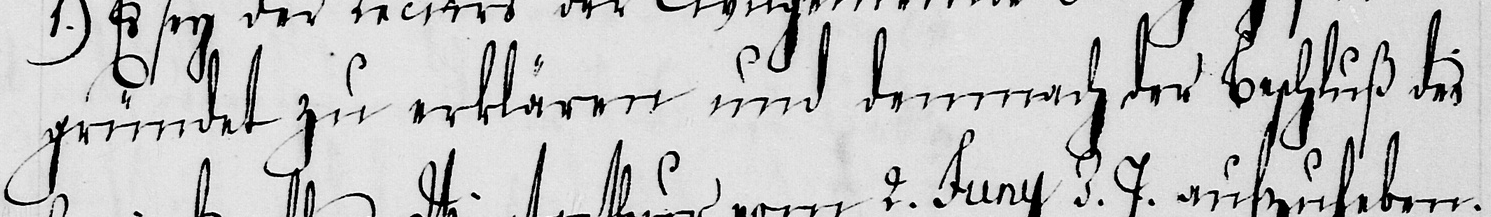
gründet zu erklären und demnach der Beschluß des
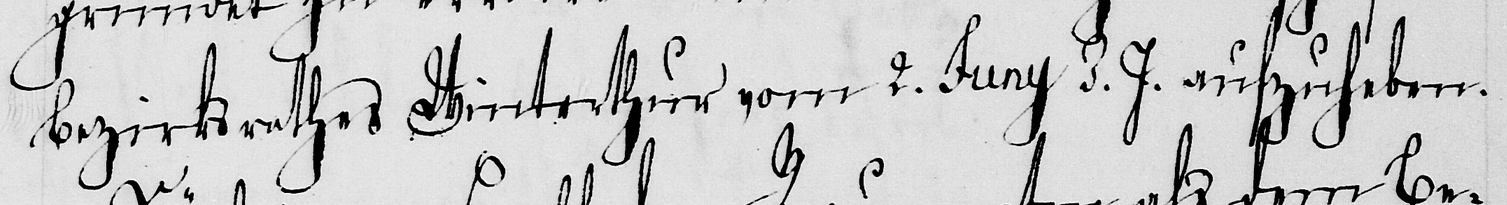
Bezirksrathes Winterthur vom 2. Juny d. J. aufzuheben.
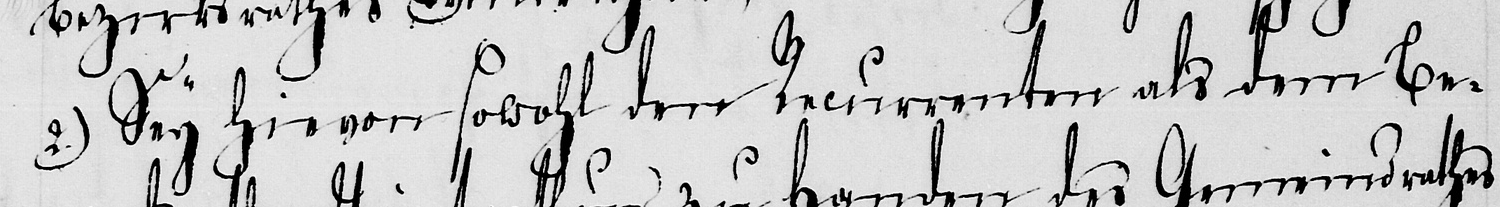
2.) Sey hievon sowohl den Recurrenten als dem Be¬
